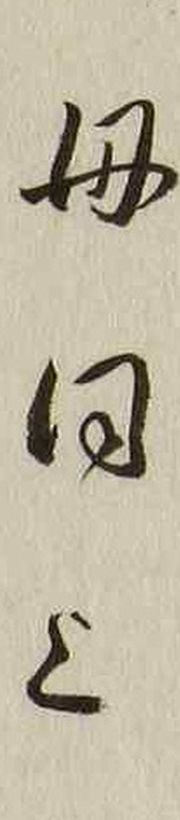母同上
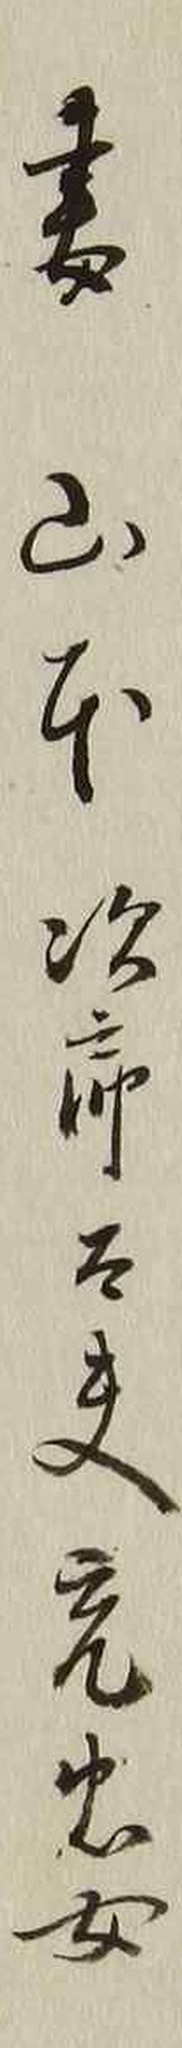妻山本次郎太夫元忠女
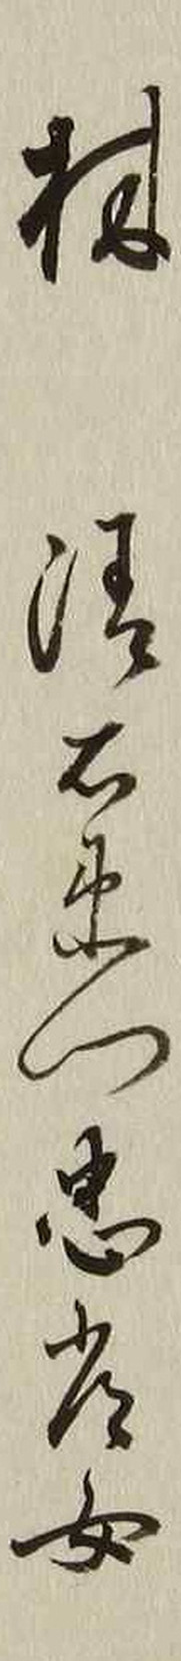林清右衛門忠常女
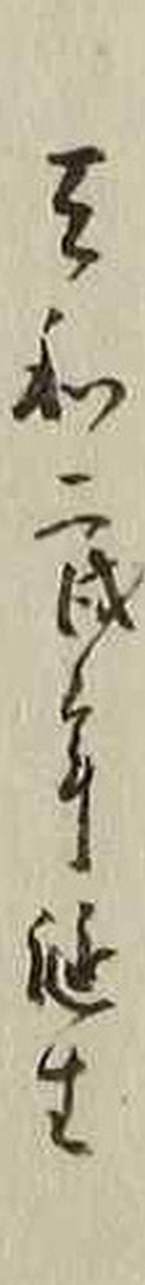天和二戌年誕生
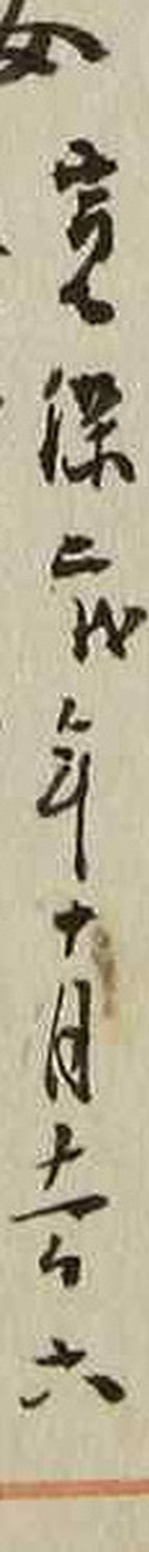寛保二戌年十月十一日六
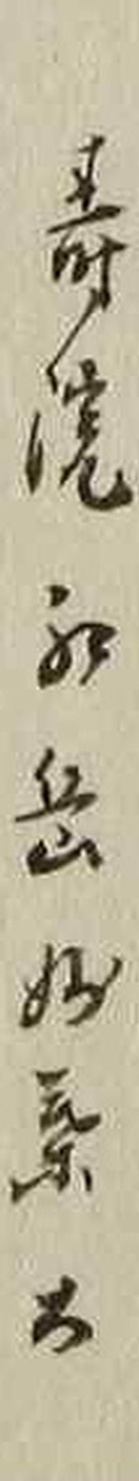寿院紅岳妙染大
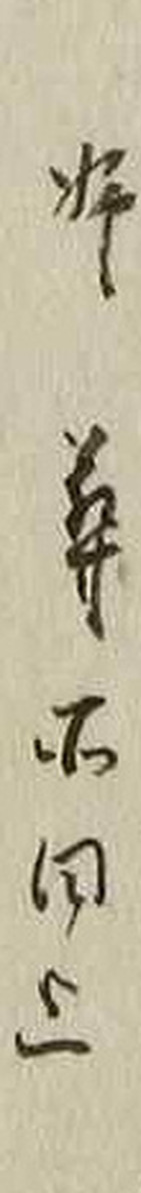姉葬所同上
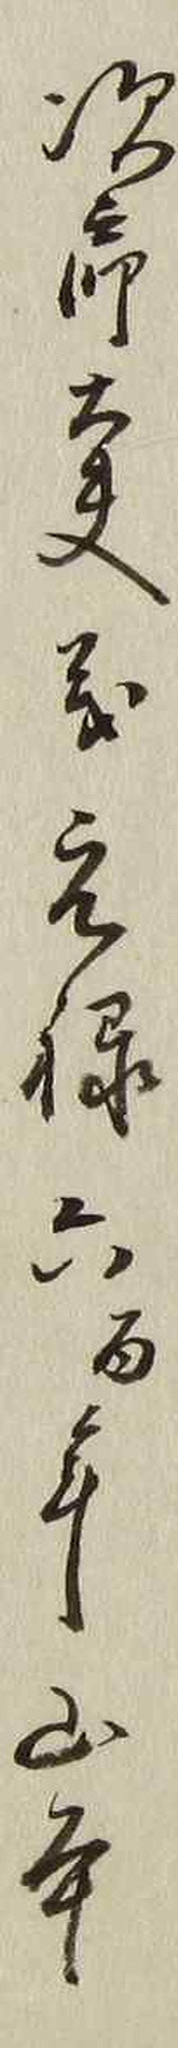次郎太夫義元禄六酉年山本
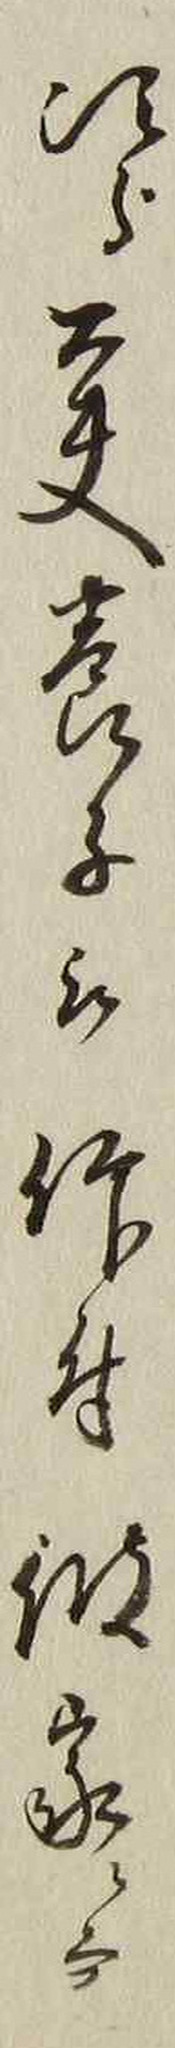次郎太夫養子被仰付彼家に而
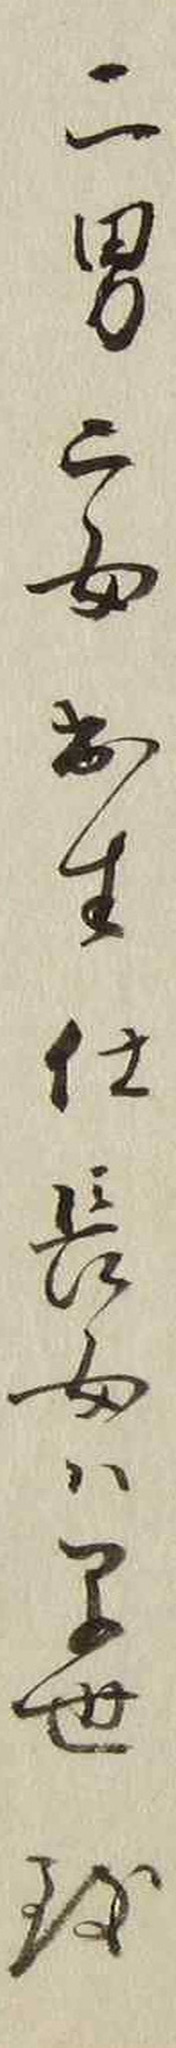二男二女出生仕長女早世致
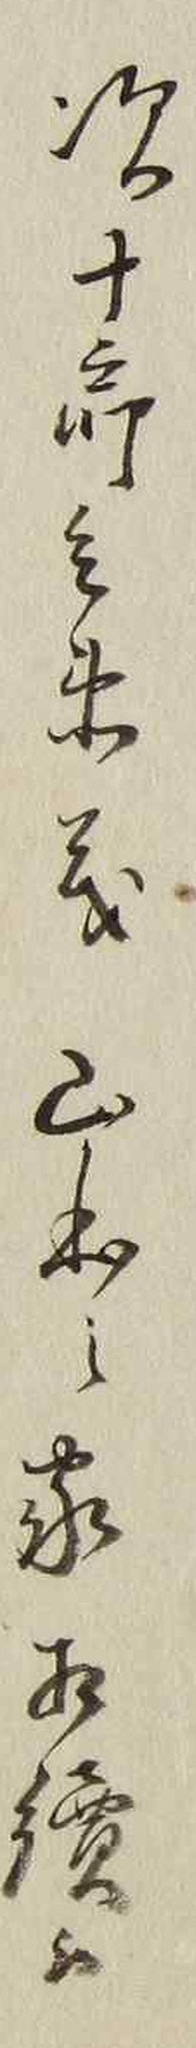次十郎兵衛義山本之家相続被
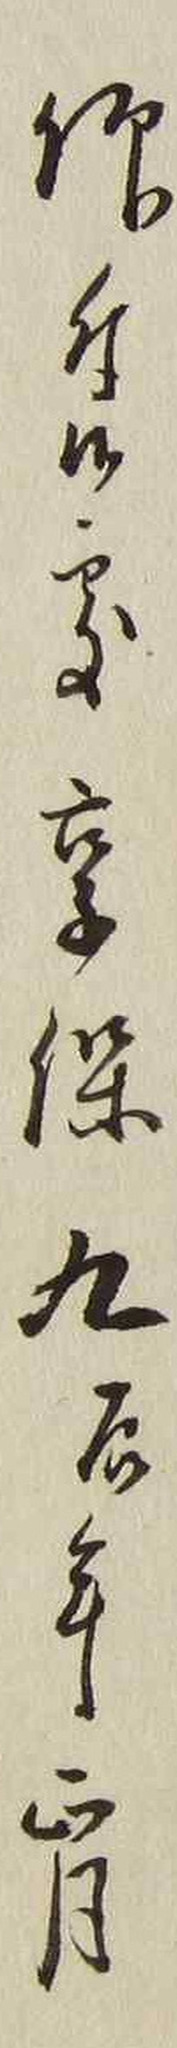仰付候処享保九辰年正月
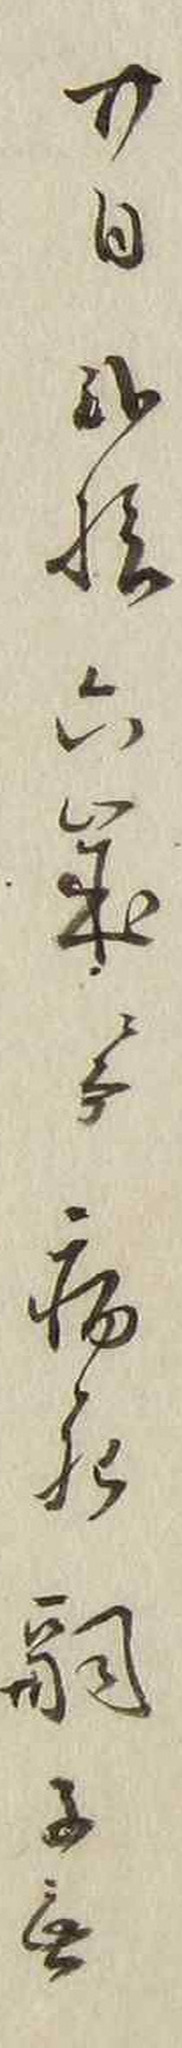廿日弐拾六歳に而病死嗣子無

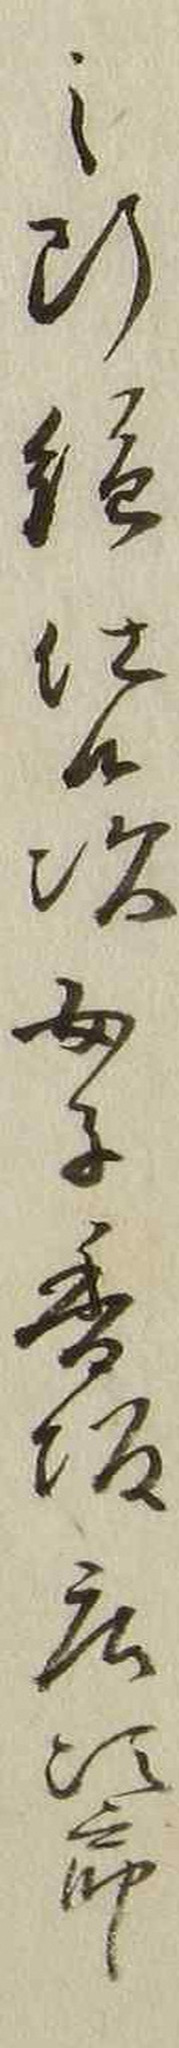之断絶仕候次女子香坂庄次郎
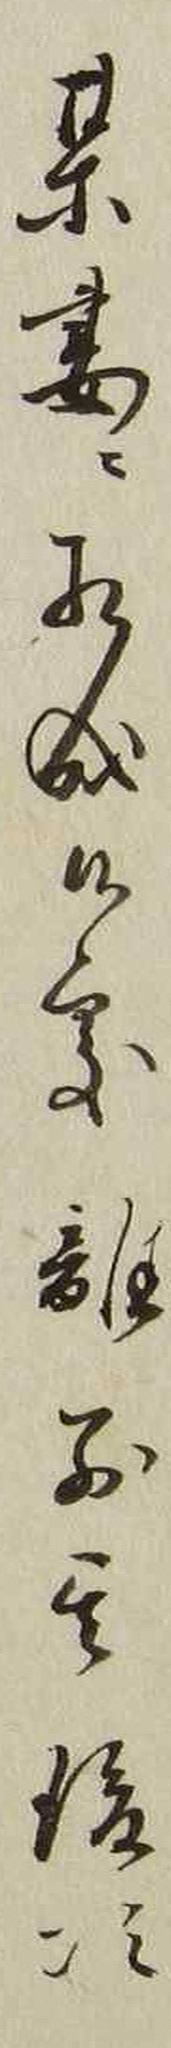某妻に相成候処離別其後次
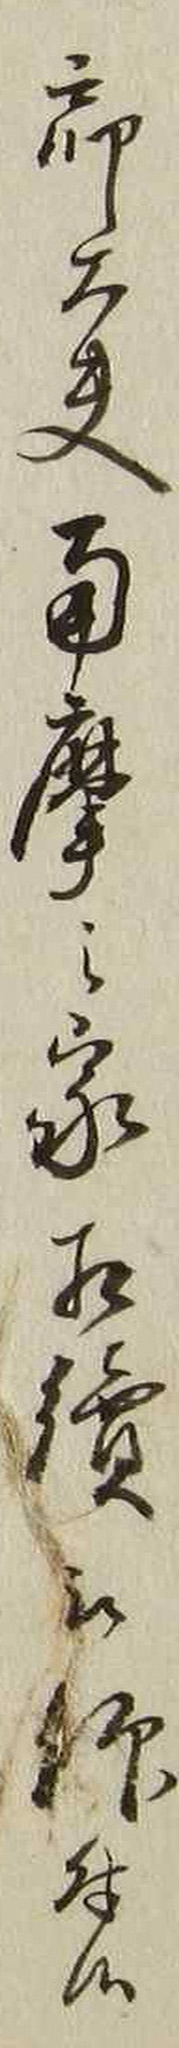郎太夫南摩之家相続被仰付候
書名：諸士系譜　巻之159　な之部1
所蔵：会津若松市立会津図書館
